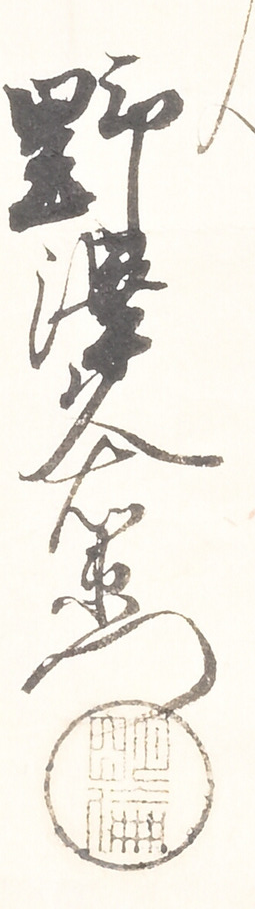野沢久右衛門㊞
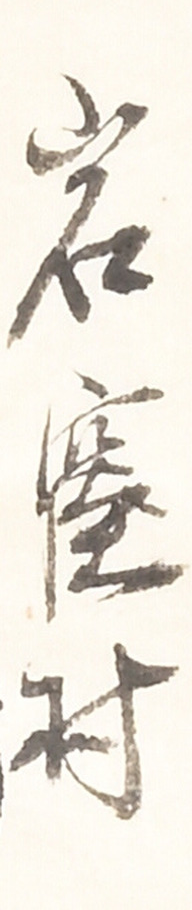岩窪村

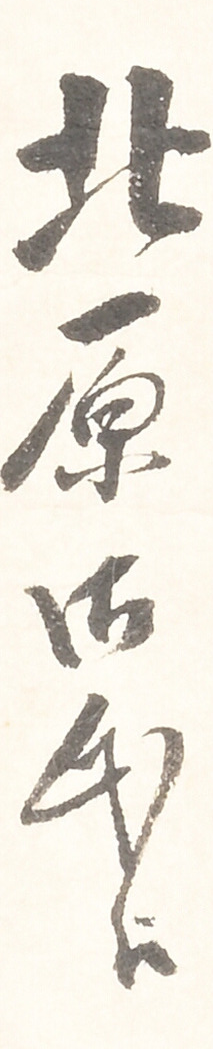北原御氏江

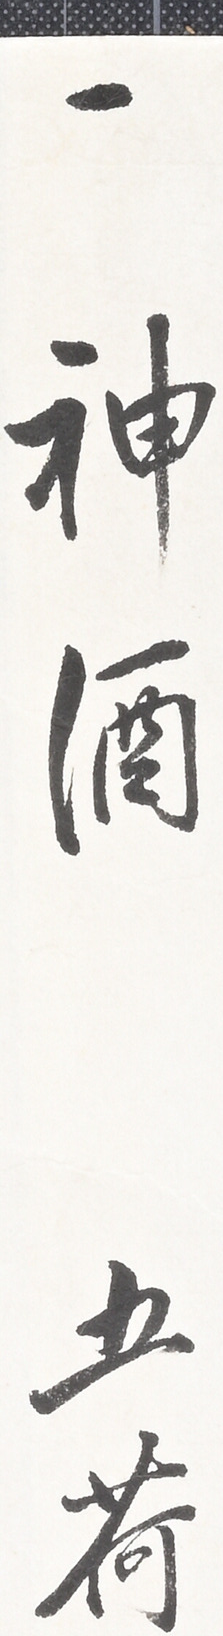一神酒五荷
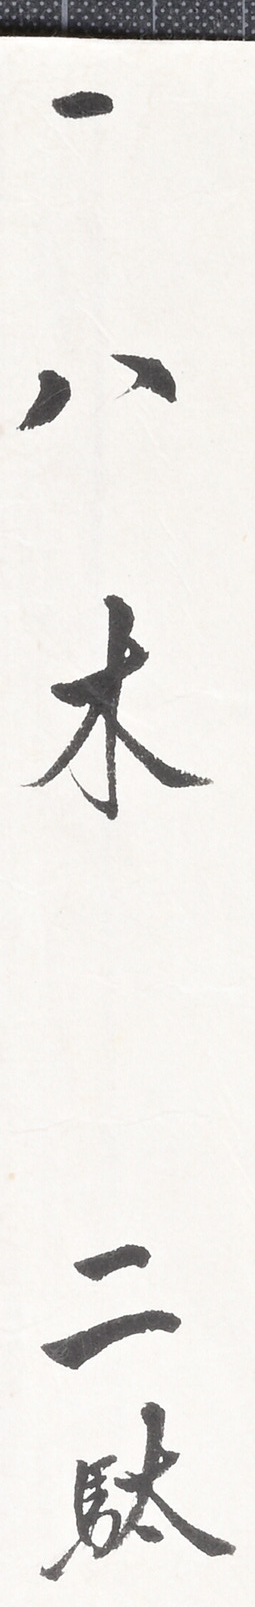一八木二駄
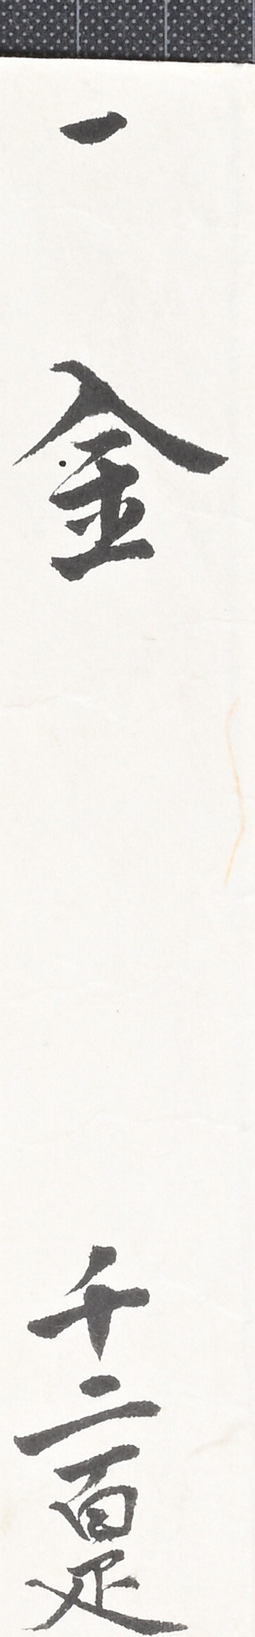一金千二百疋
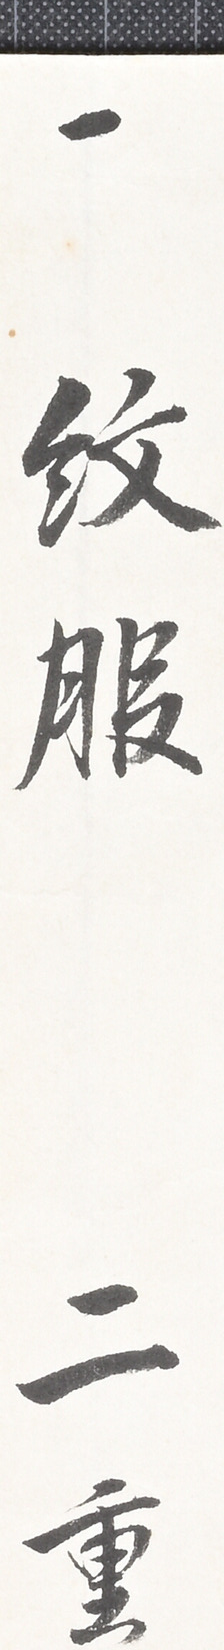一紋服二重
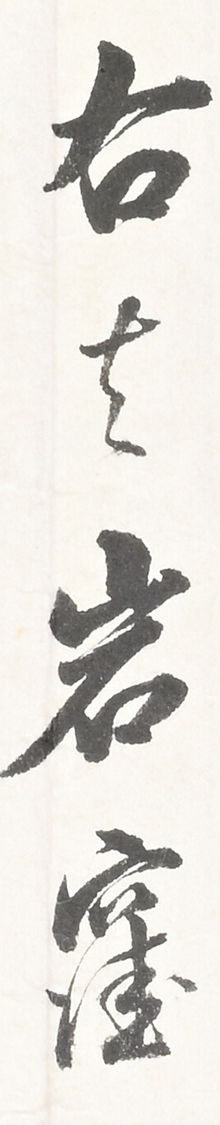右者岩窪
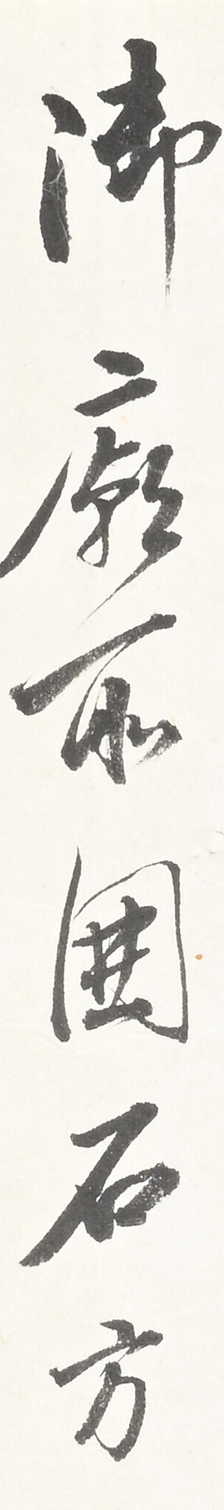御廟所囲石方
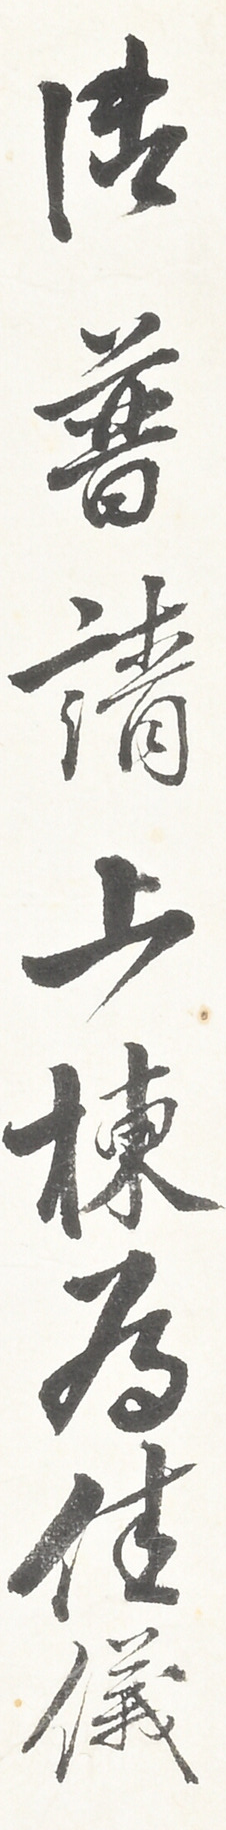御普請上棟為佳儀
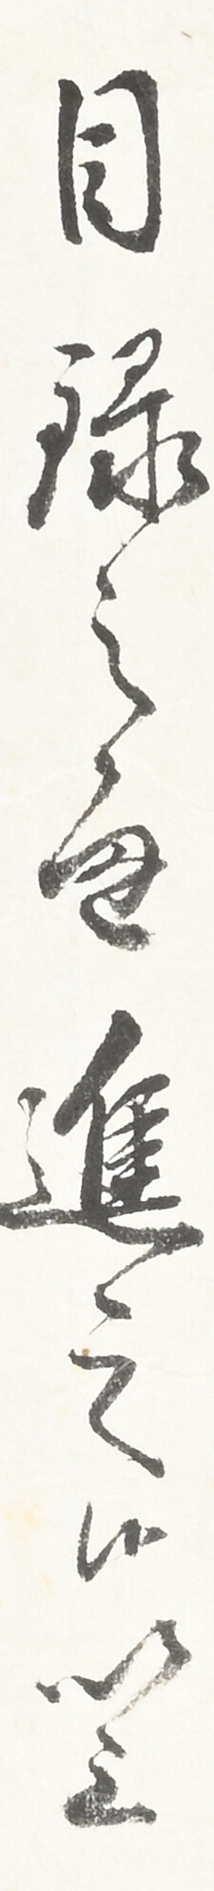目録之通進之候以上
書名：天保十亥年六月武田信玄様御玉垣仕様書上帳
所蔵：伊那市立高遠町図書館・合同会社AMANE
